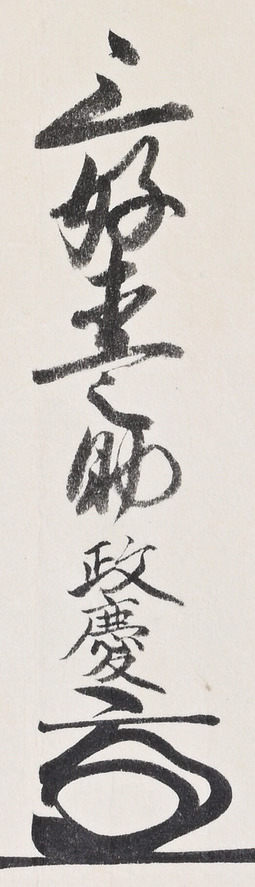三好杢之助政慶
